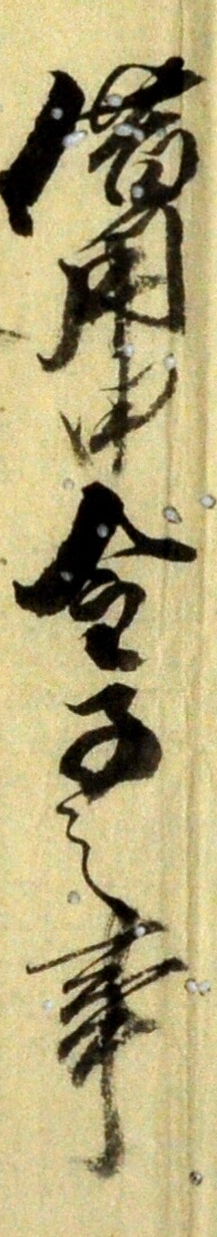借用申金子之事
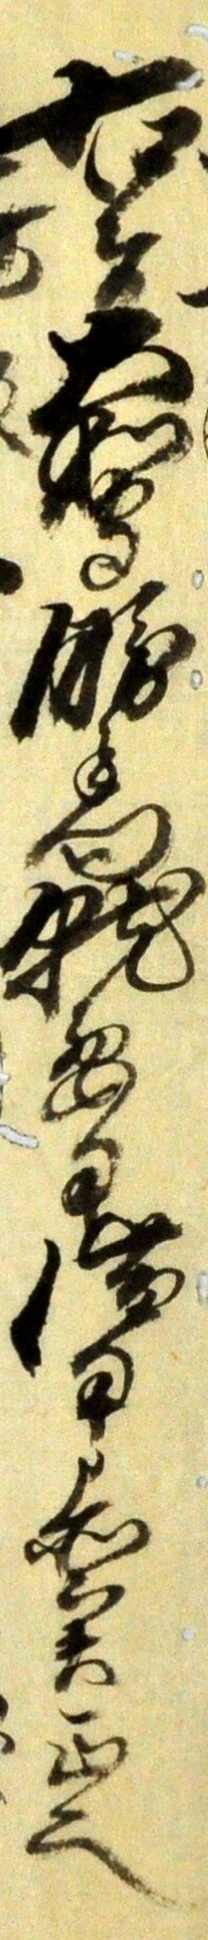右は大和守勝手向就要用借用申所実正也
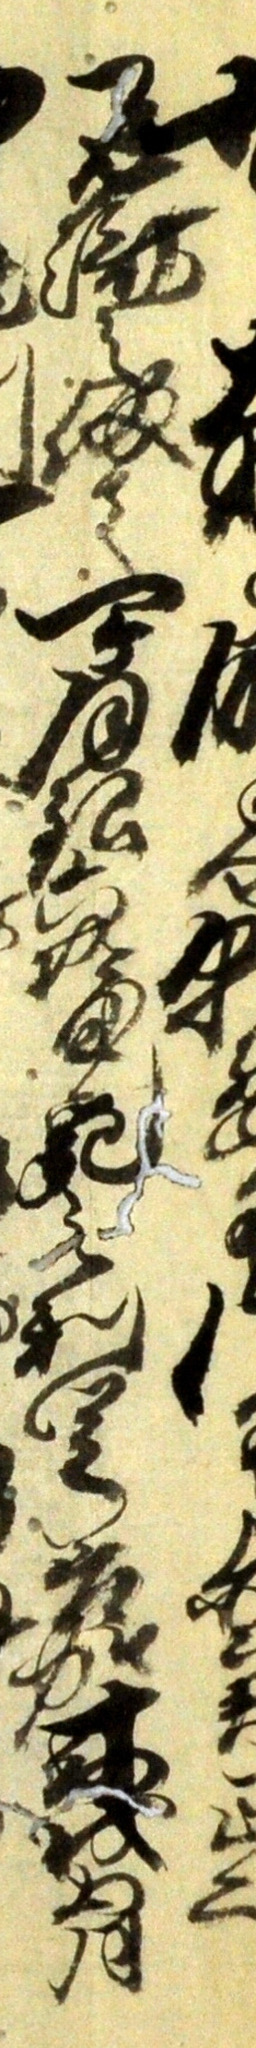返済之儀は一ヶ月六拾匁宛之利足差加来戌五月
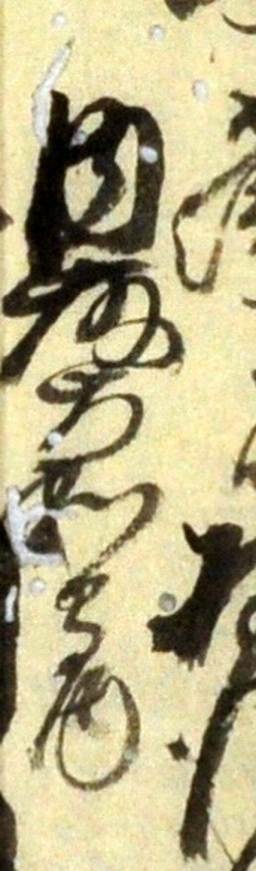内藤大和守内
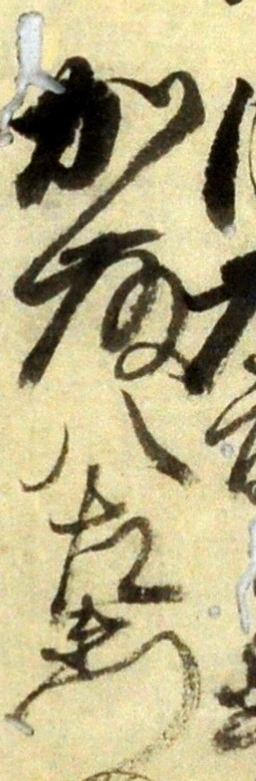加藤八左衛門㊞
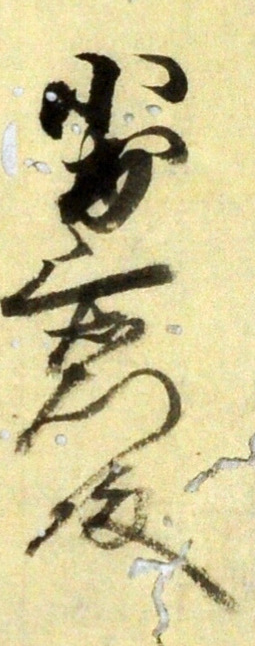小出三右衛門殿
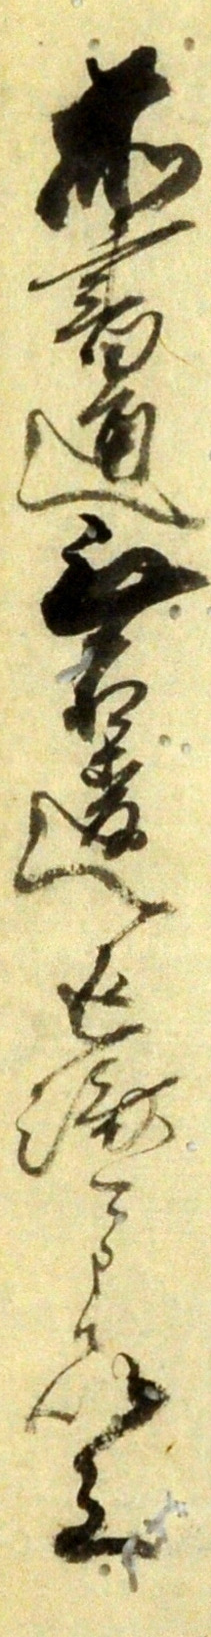前書之通無相違返済可申候以上
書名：金子借用証文
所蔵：伊那市立高遠町図書館・合同会社AMANE
